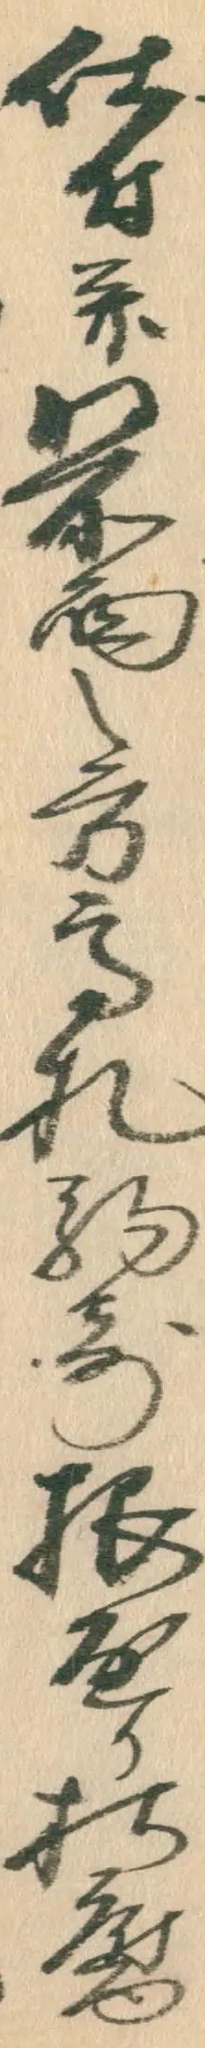仕付并同前西之方高札駒寄根懸り朽腐
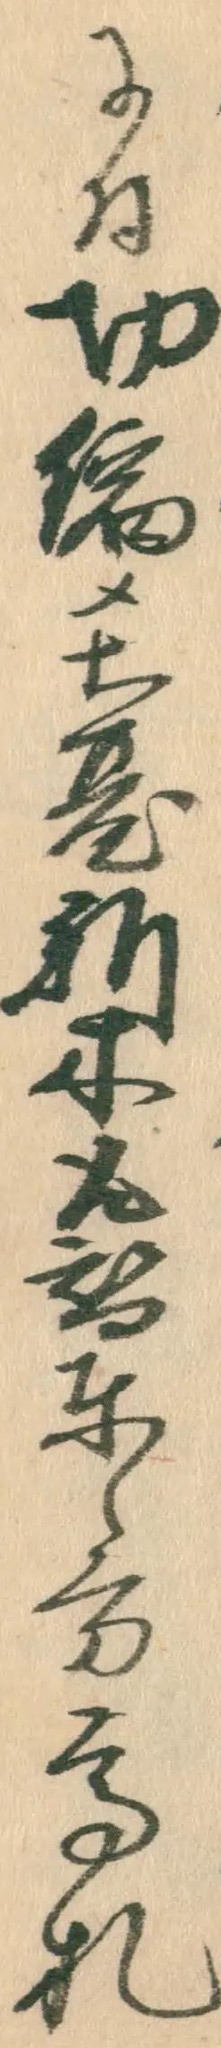に付切縮メ土台新木取替東之方高札

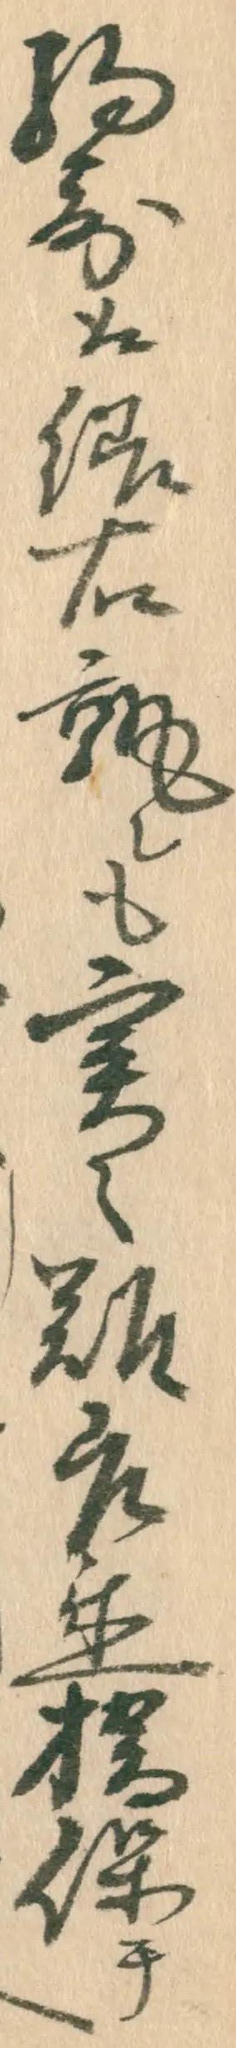駒寄取繕右孰レも実ニ難差置橋保チ
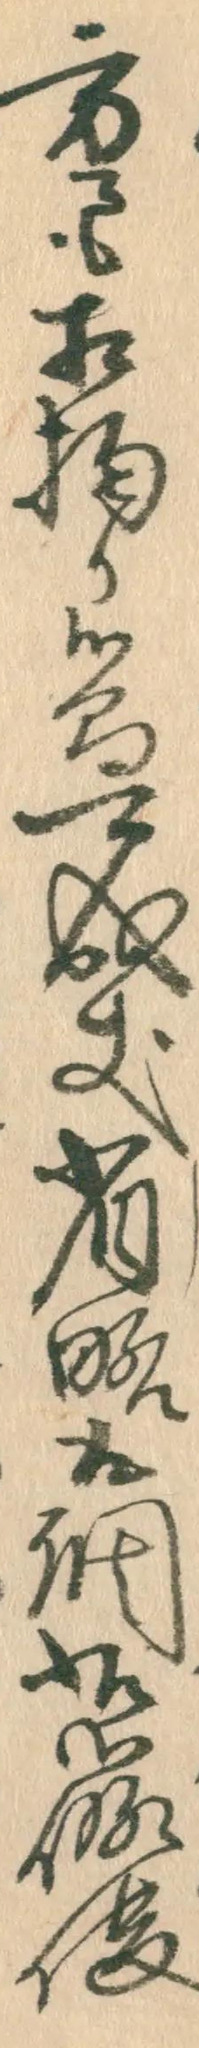方ニも相拘り候間可成丈省略取調右御修復
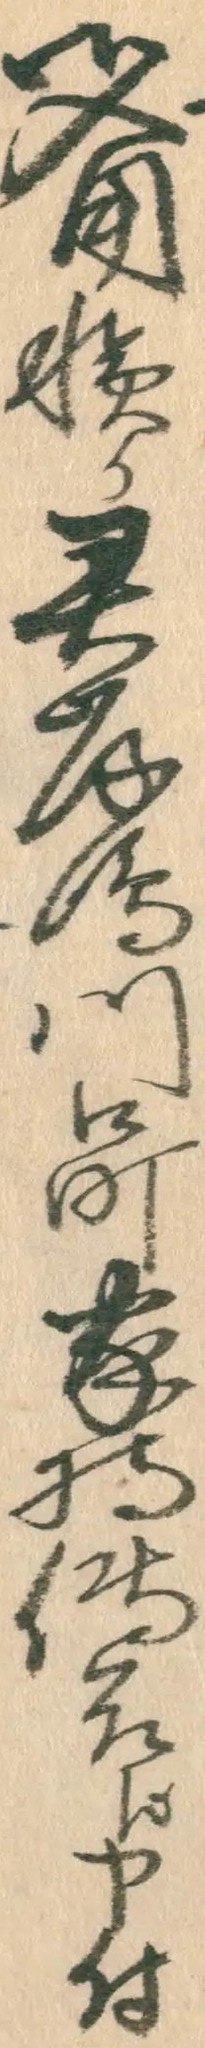御入用積り霊岸島川口町家持伝吉え申付
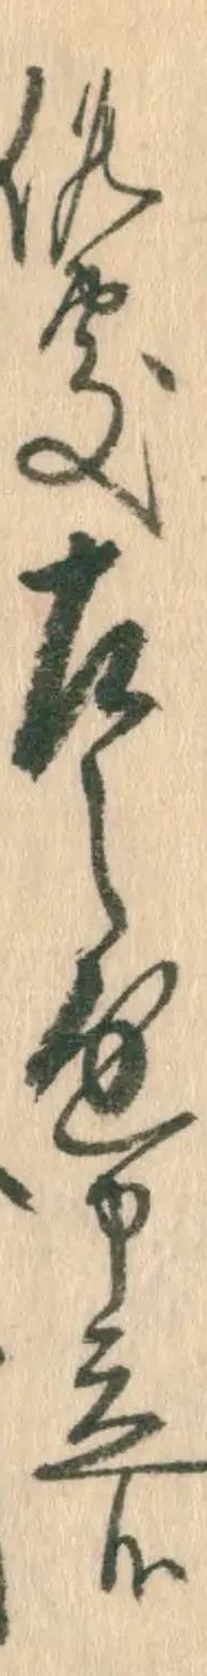候処左之通申立候
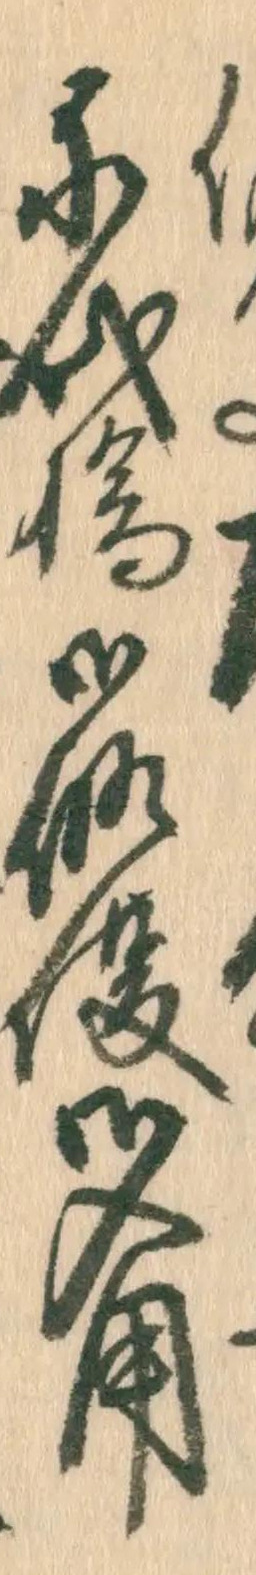永代橋御修復御入用
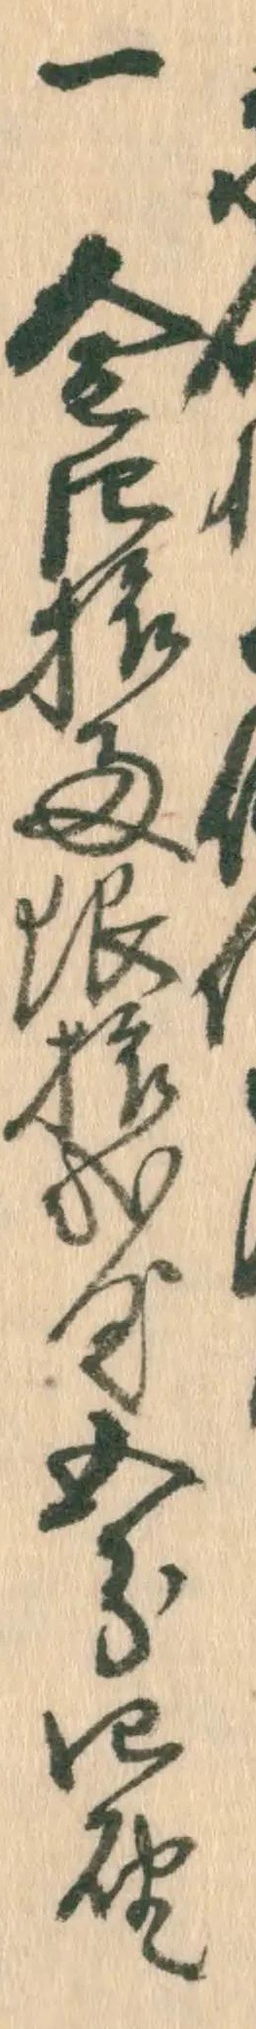一金四拾両銀拾弐匁五分四厘
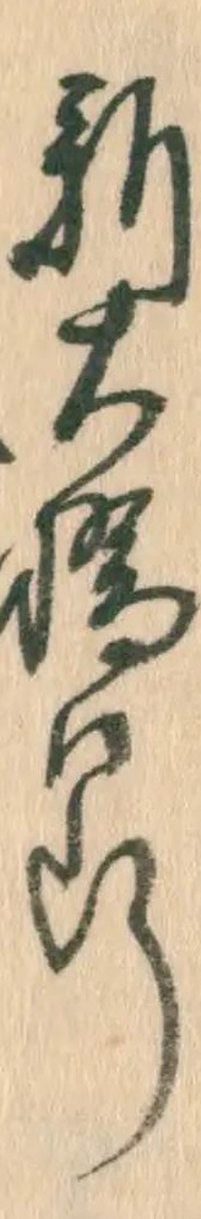新大橋同断
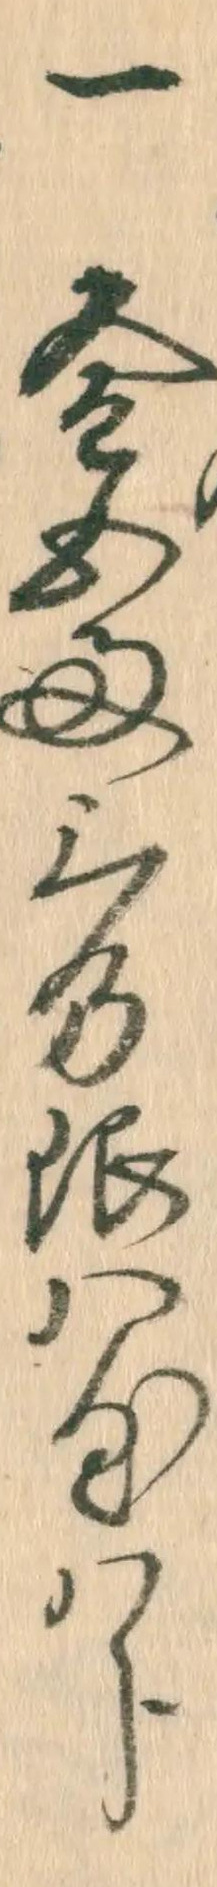一金五両三分銀八匁八分
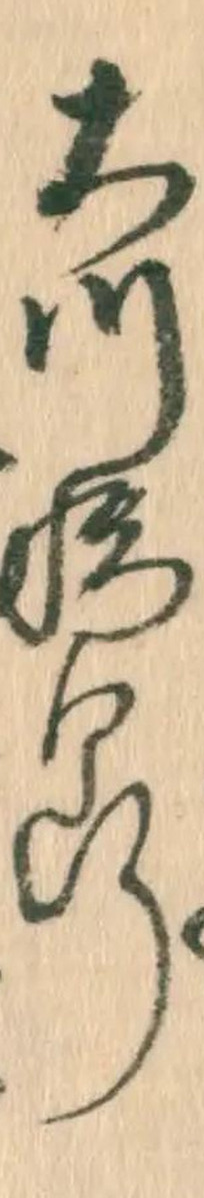大川橋同断
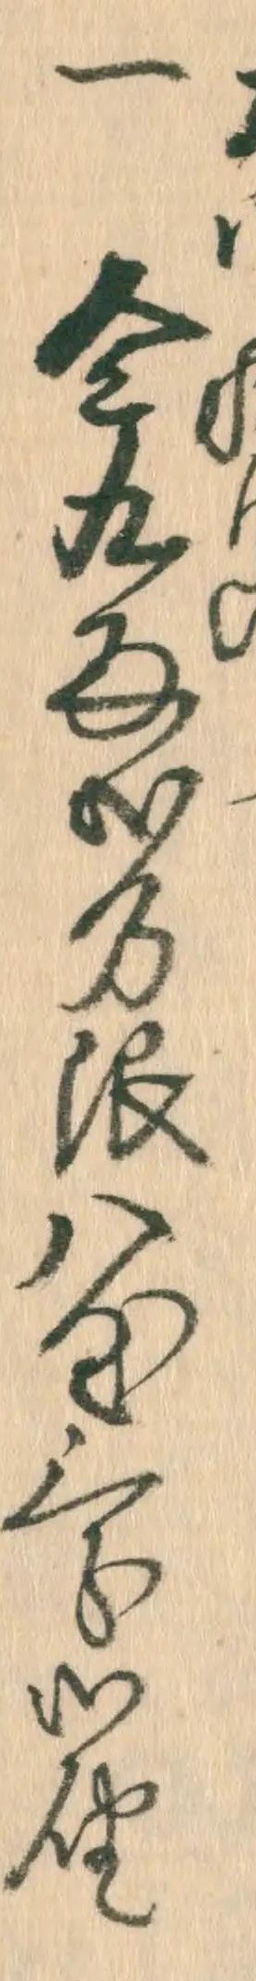一金九両弐分銀八匁三分弐厘
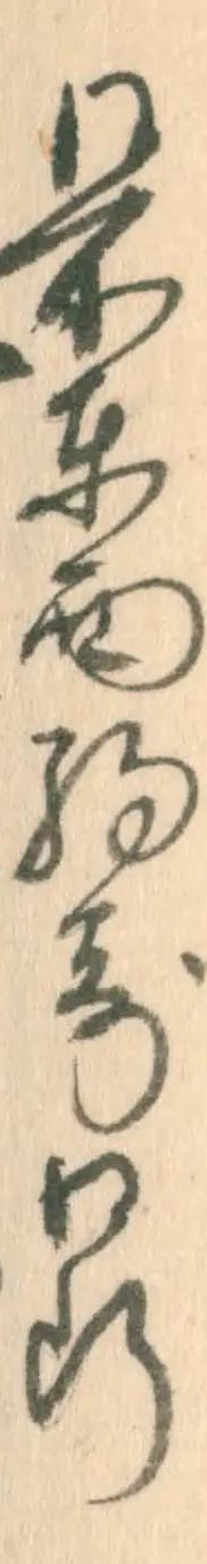同所東西駒寄同断
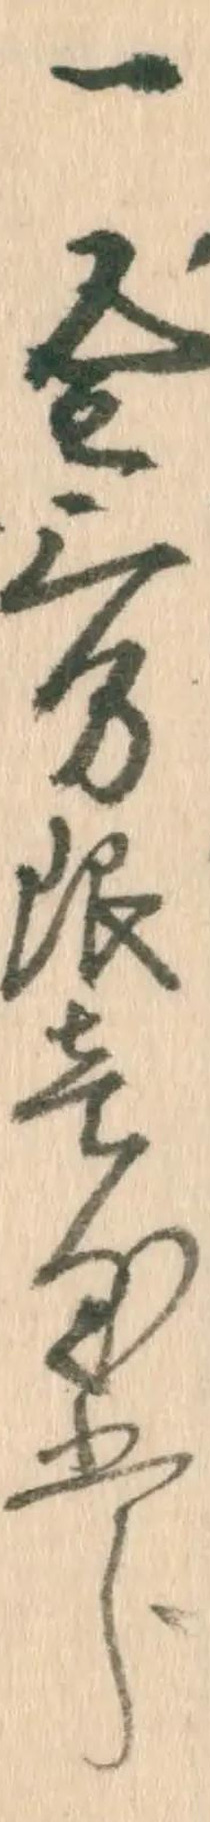一金三分銀壱匁五分
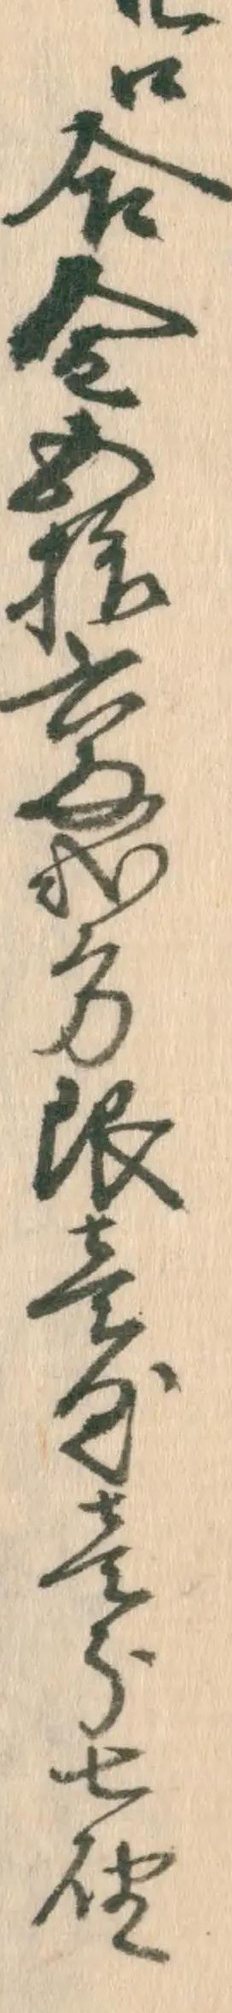合金五拾六両弐分銀壱匁壱分七厘
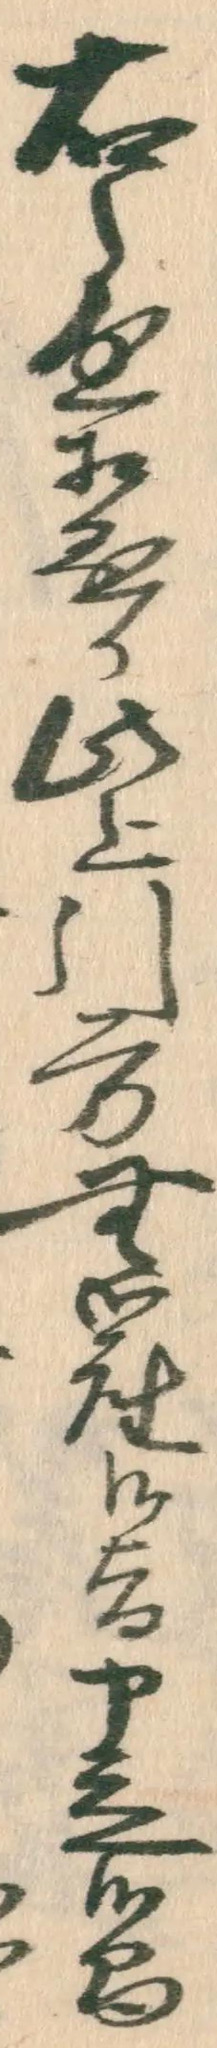右之通相懸り此上引方無御座候旨申立候間
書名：三橋 17巻. [8] 三橋小破御修復書留　但御奉行御掛リ替地震潰橋番屋　嘉永四亥年より安政二卯年迄　下
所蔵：国立国会図書館 National Diet Library, JAPAN
